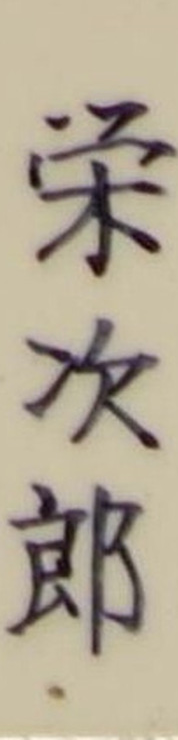栄次郎
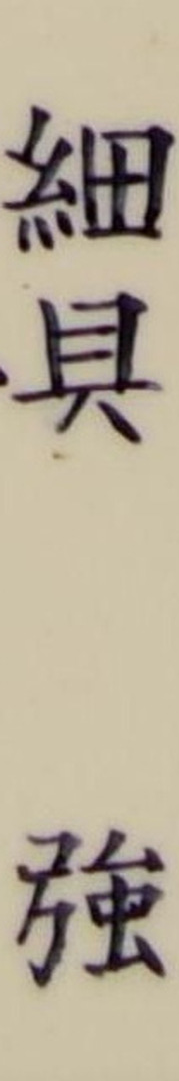細具強
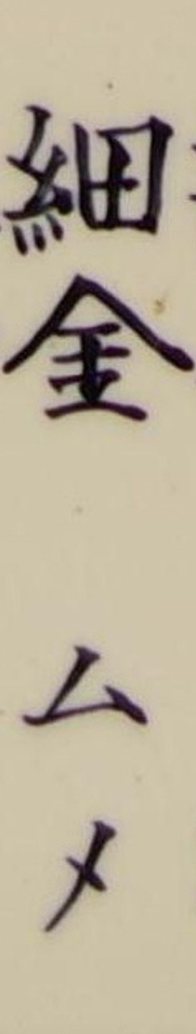細金ムメ
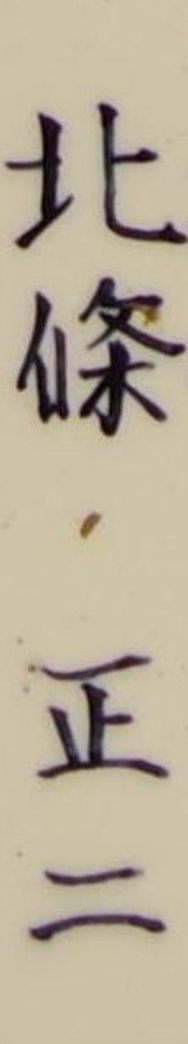北條正二
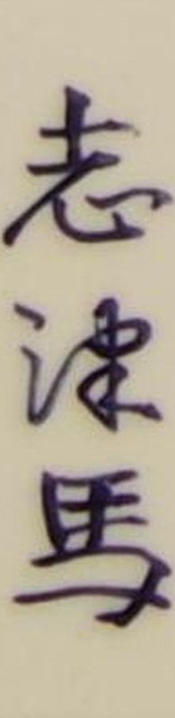志津馬
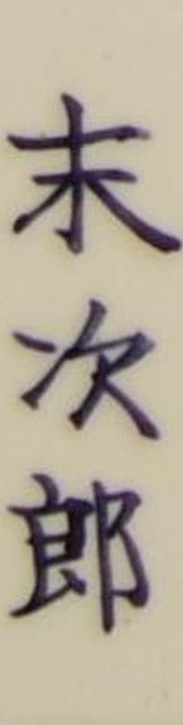末次郎
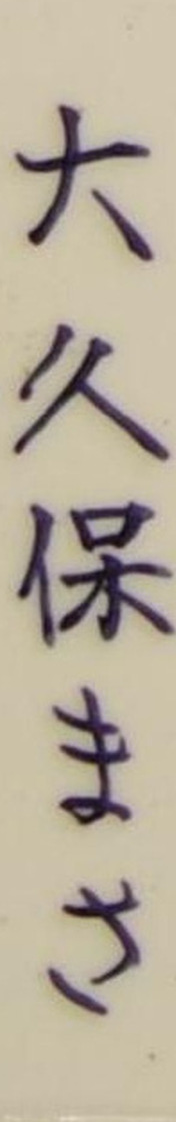大久保まさ

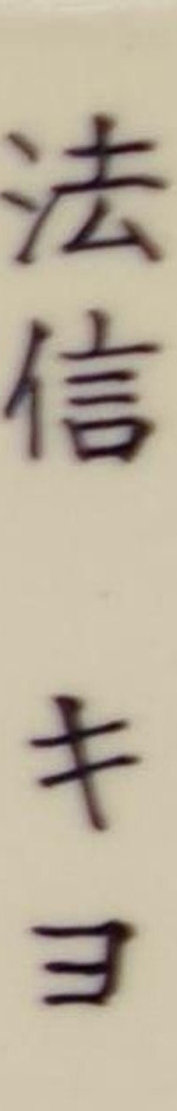法信キヨ
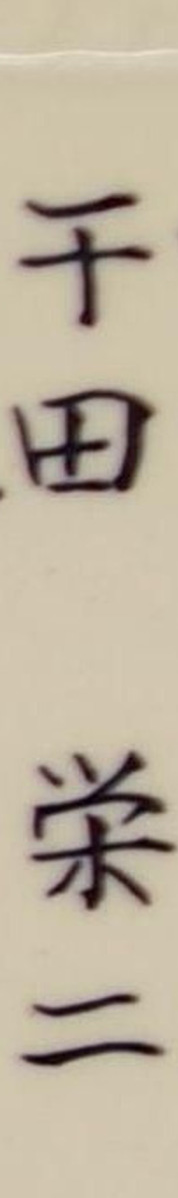千田栄二
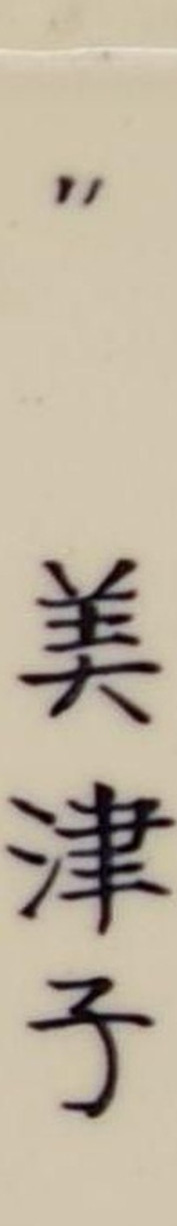美津子
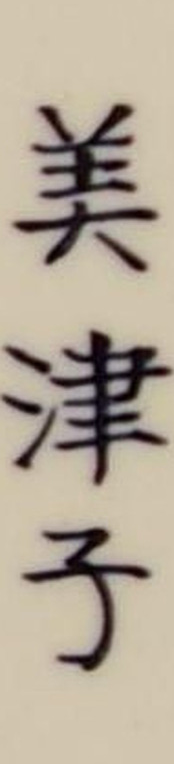美津子
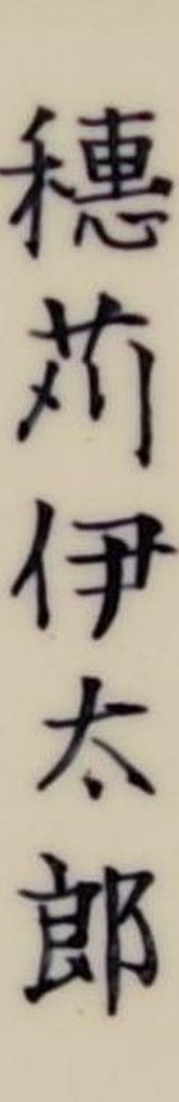穂苅伊太郎
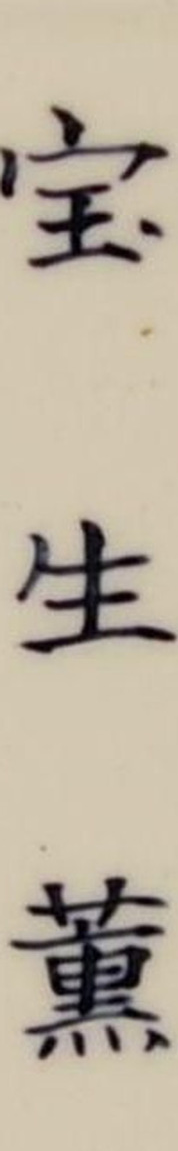宝生薫
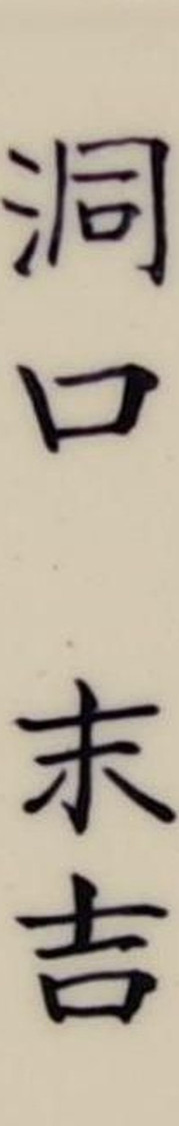洞口末吉
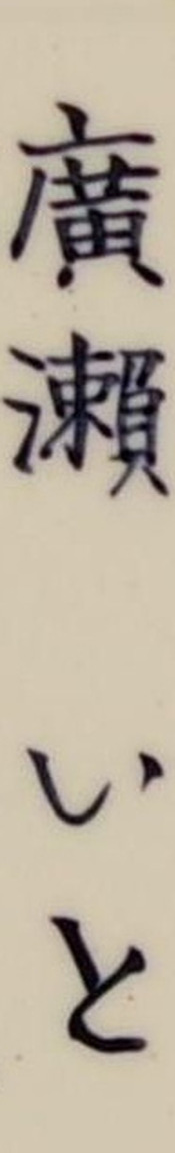廣瀬いと
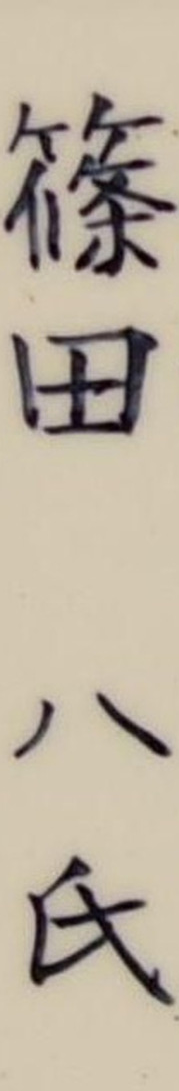篠田八氏
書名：A~D
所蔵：koyasan kongobuji
